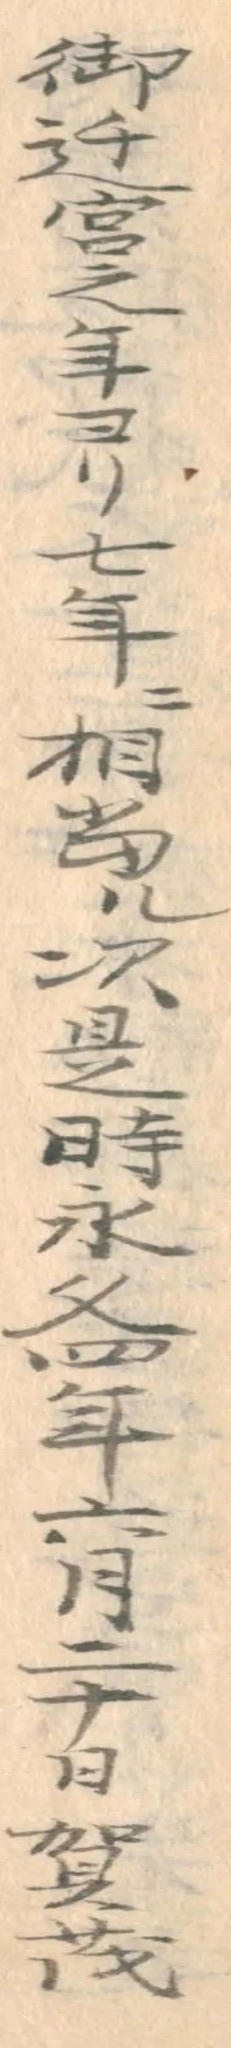御遷宮之年ヨリ七年ニ相当ル次是時永久四年六月二十日賀茂
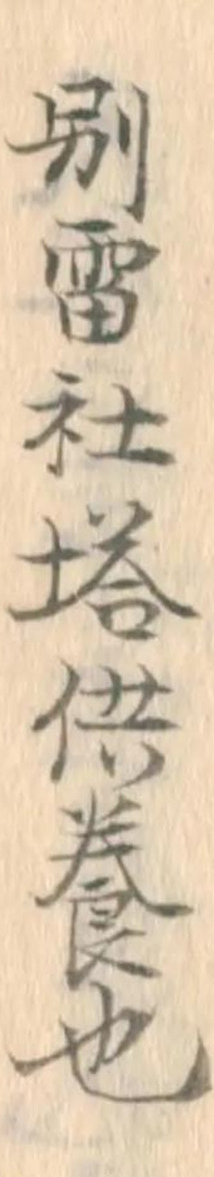別雷社塔供養也
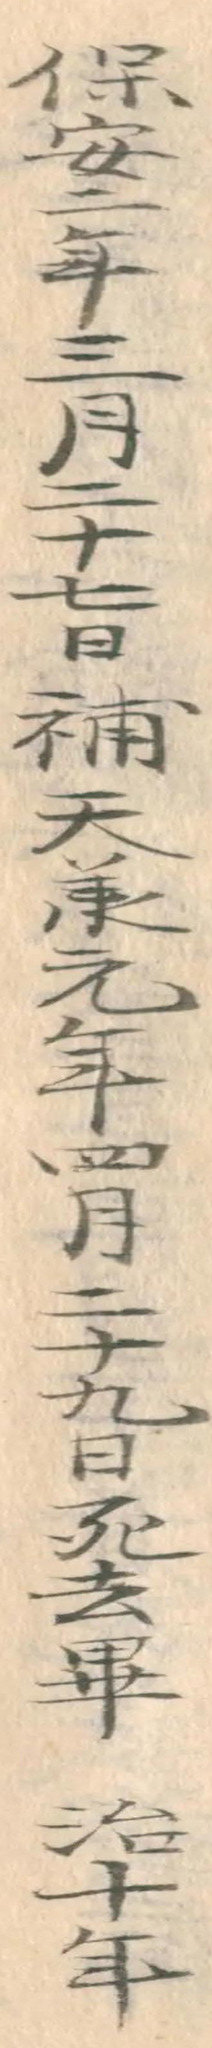成家保安二年三月二十七日補天承元年四月二十九日死去畢治十年
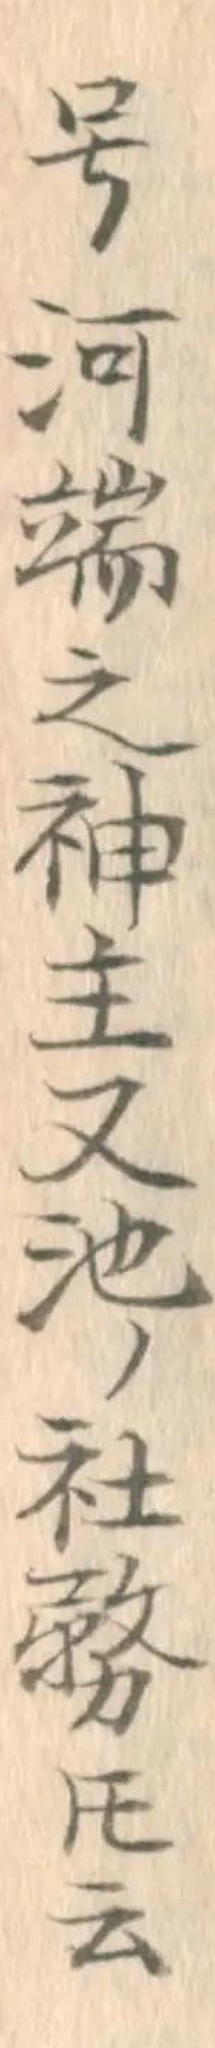号河端之神主又池ノ社務トモ云
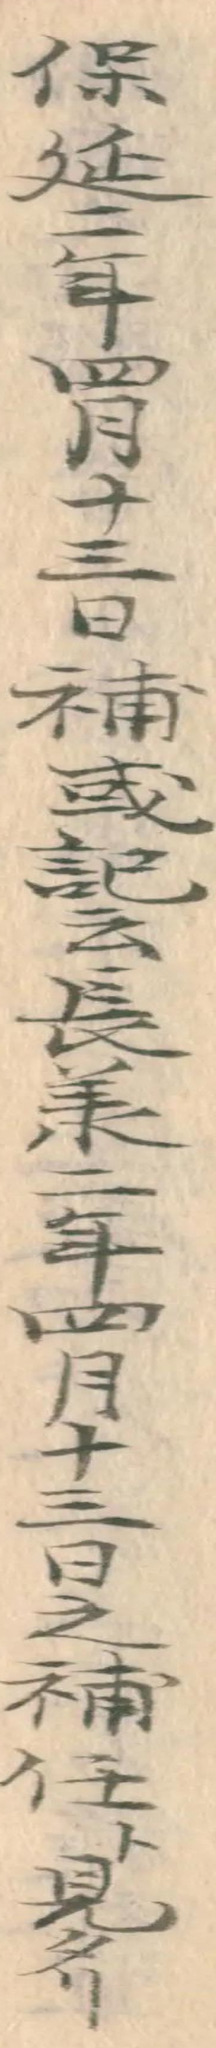成重保延二年四月十三日補或記云長承二年四月十三日之補任ト見タリ
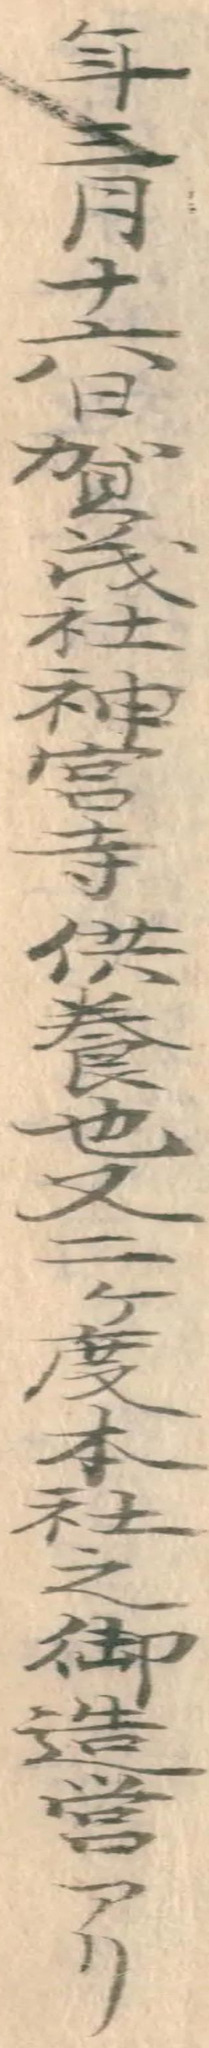年三月十六日賀茂社神宮寺供養也又二ケ度本社之御造営アリ
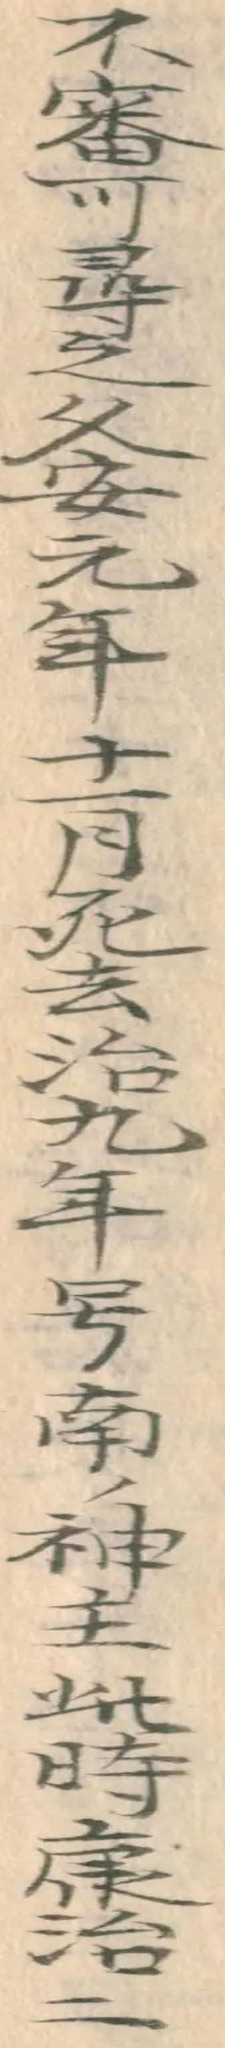不審可尋之久安元年十一月死去治九年号南ノ神主此時康治二
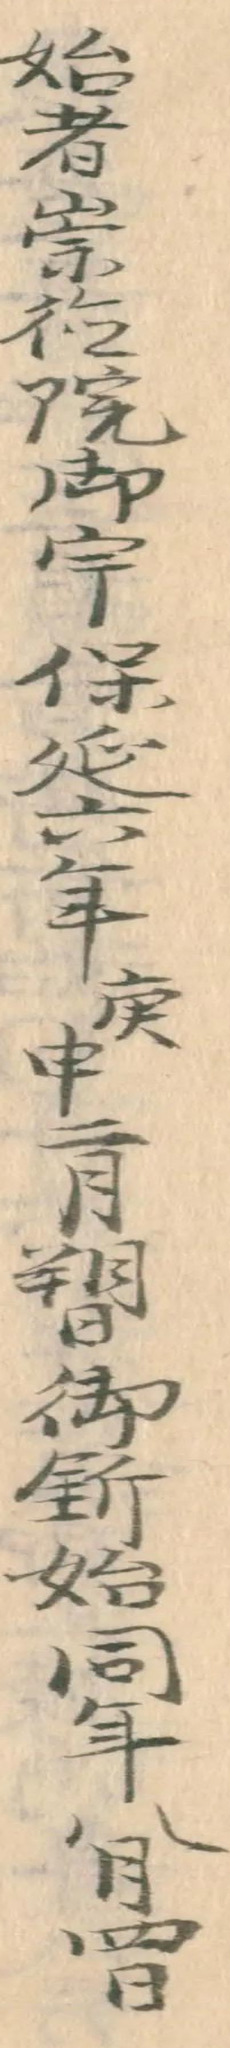始者崇徳院御宇保延六年庚申二月朔日御釿始同年八月四日
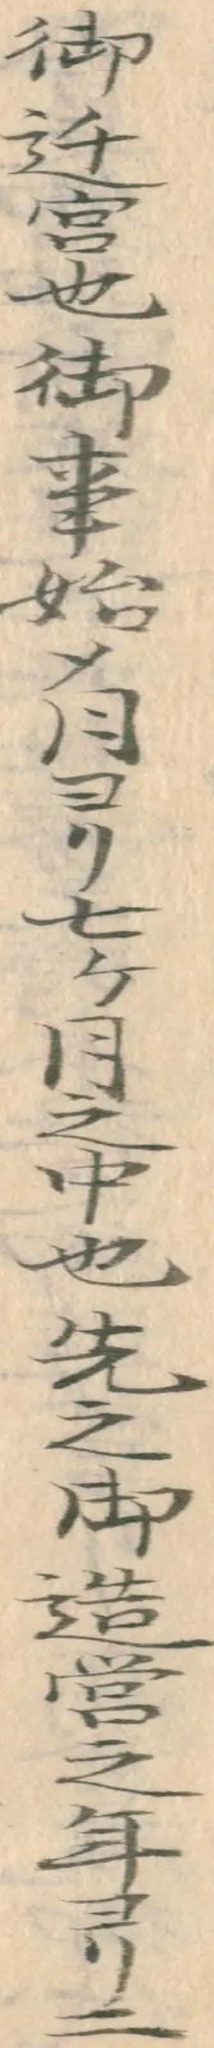御遷宮也御事始メ月ヨリ七ケ月之中也先之御造営之年ヨリ二
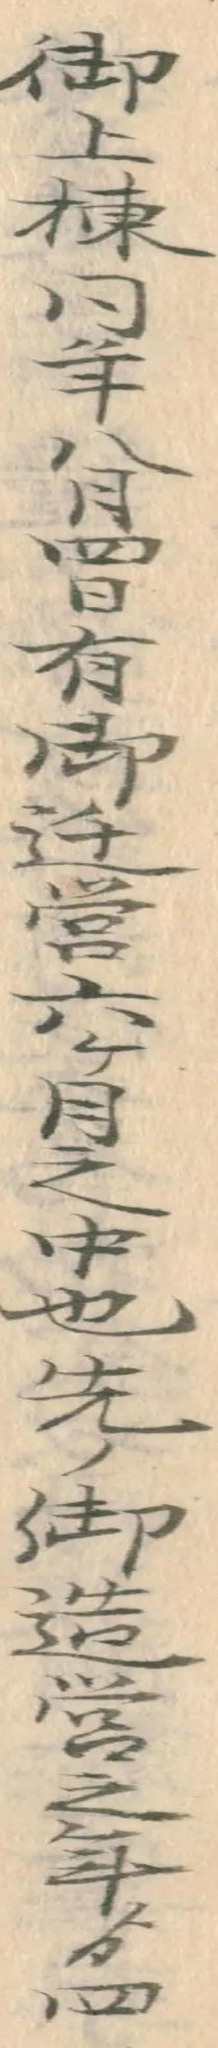御上棟同年八月四日有御遷宮六ケ月之中也先ノ御造営之年ゟ四
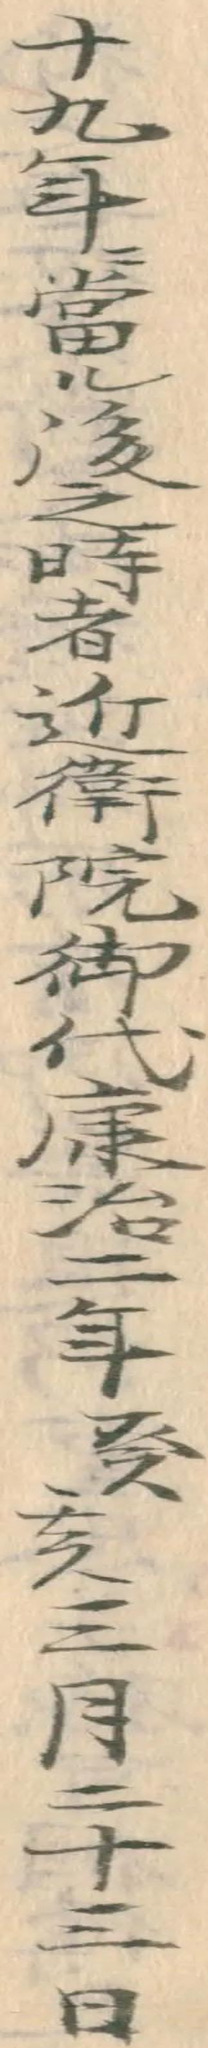十九年ニ当ル後之時者近衛院御代康治二年癸亥三月二十三日
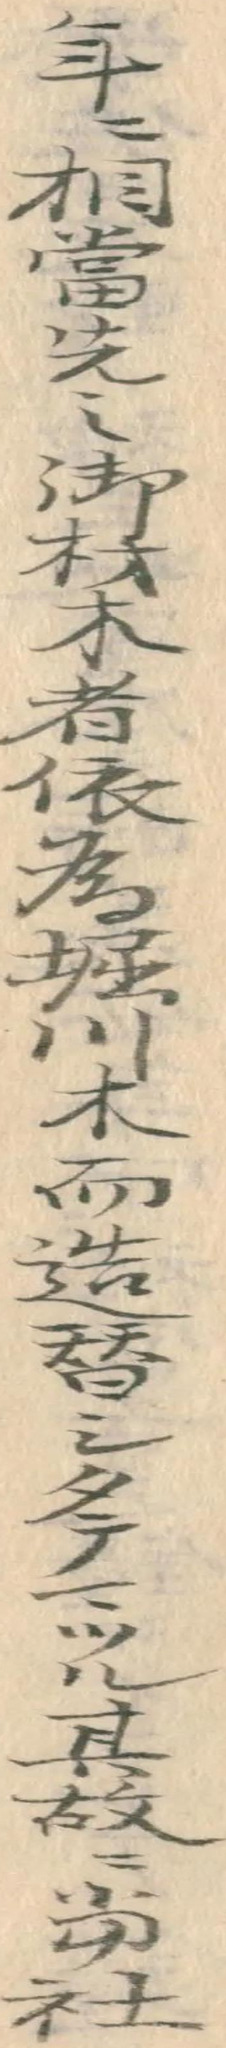年ニ相当先之御材木者依為堀川木而造替シタテマツル其故ニ当社
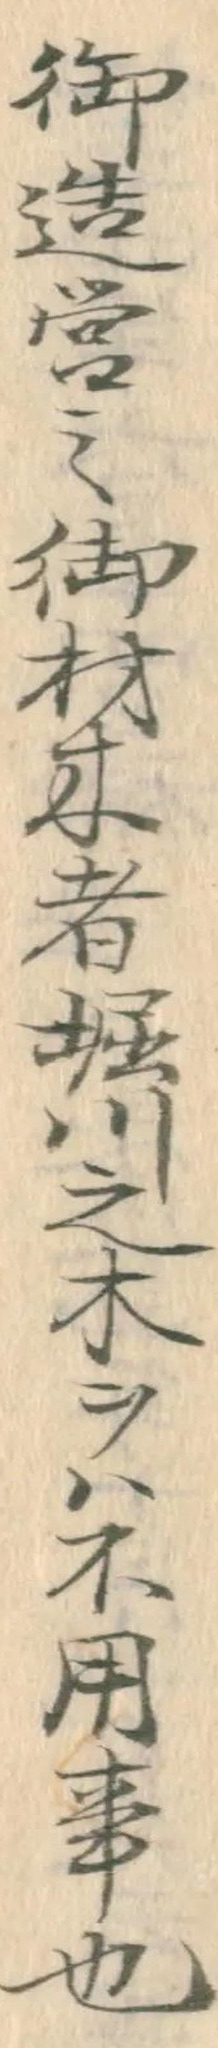御造営之御材木者堀川之木ヲハ不用事也
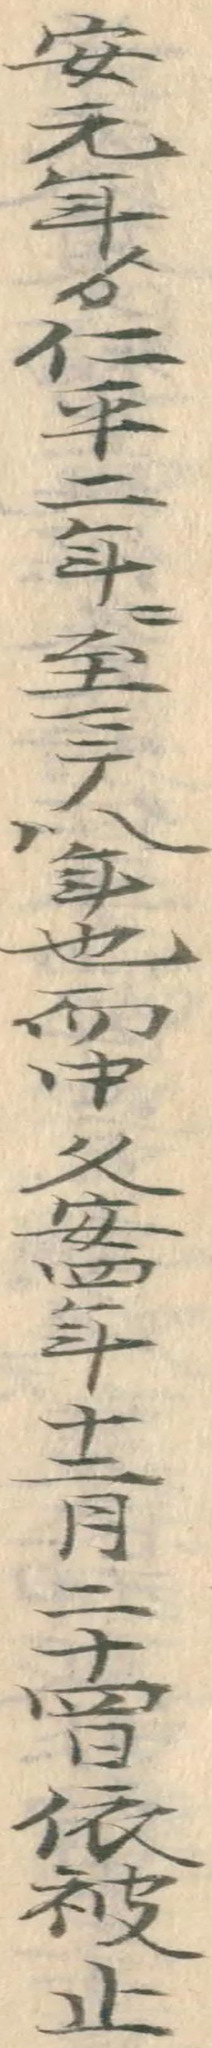安元年ゟ仁平二年ニ至マテ八年也而中久安四年十二月二十四日依被止
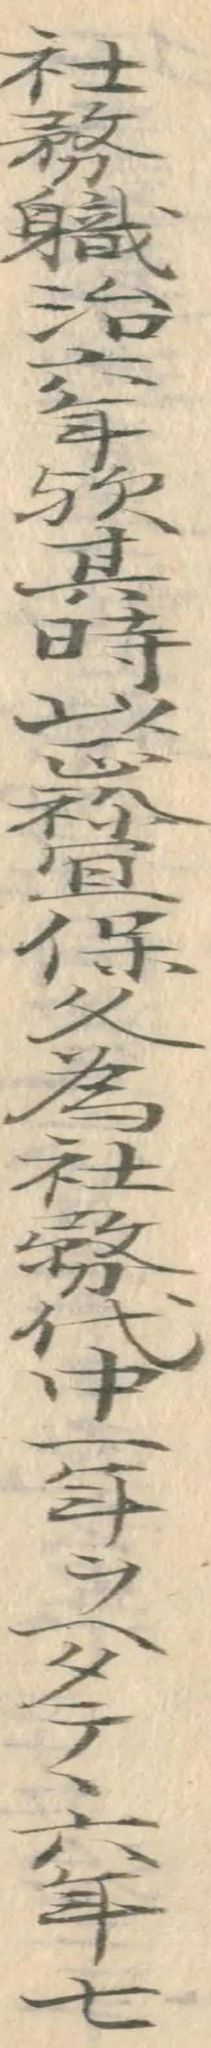社務職治六年歟其時以正祢宜保久為社務代中一年ヲヘタテヽ六年七
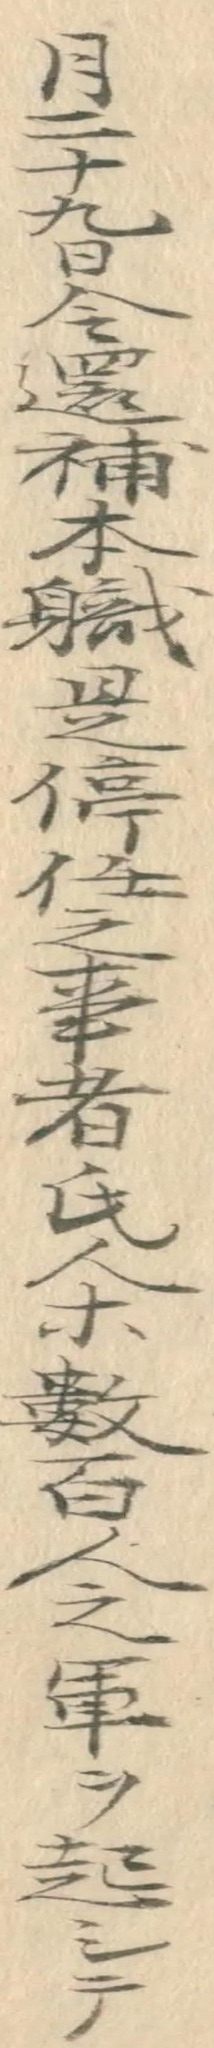月二十九日令還補本職是停仕之事者氏人等数百人之軍ヲ起シテ
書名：賀茂社記録. 第24冊
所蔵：国立国会図書館 National Diet Library, JAPAN
